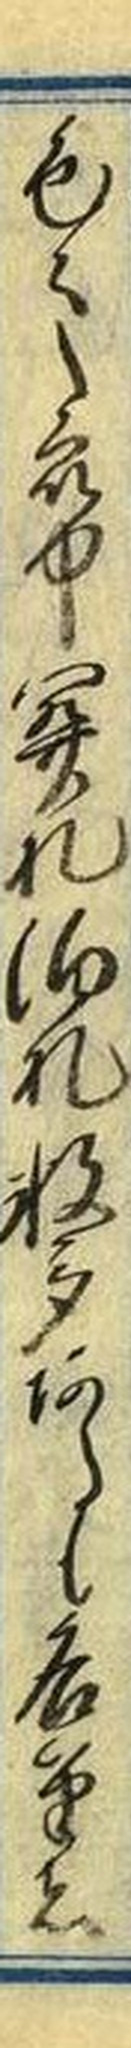色々之衆中関札泊札数多あるも各筆者
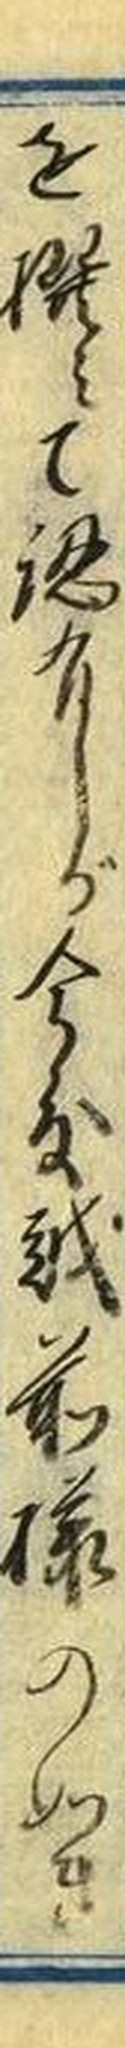を撰みて認有りしが今度越前様の如き
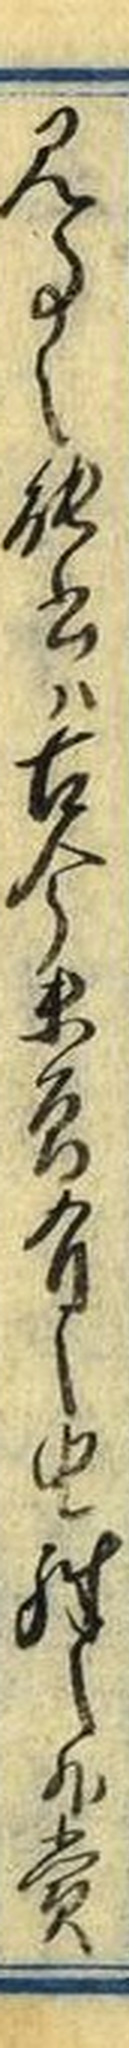見事之能書は古今未曾有之由殊之外賞
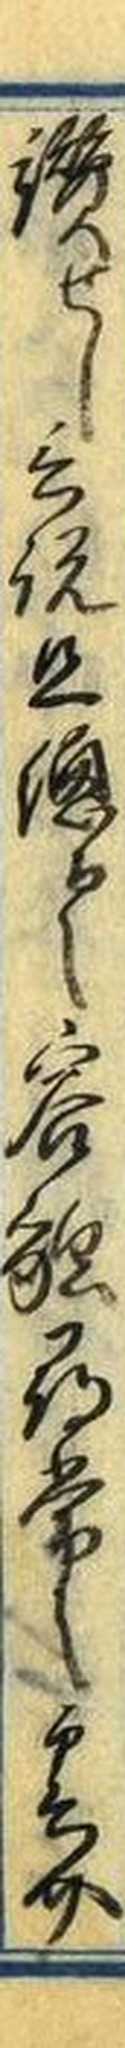讃せし言説且総而之容貌尋常之雲介

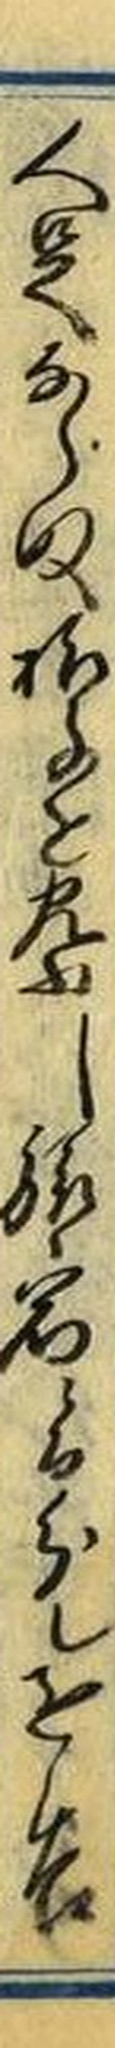人足ならぬ様子を察し旅宿に而分れを告
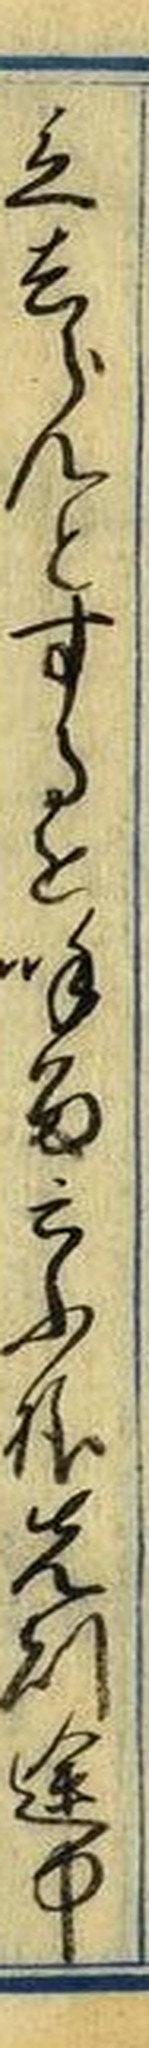立去らんとするを呼留言ふ様先刻途中
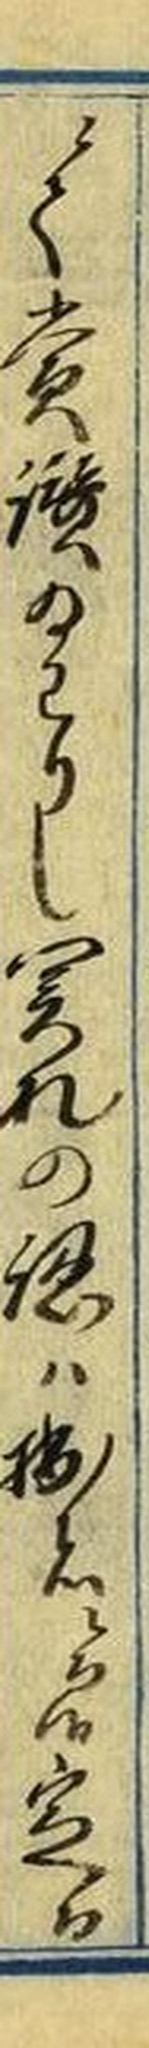にて賞讃給わりし関札の認は拙者に而候定而
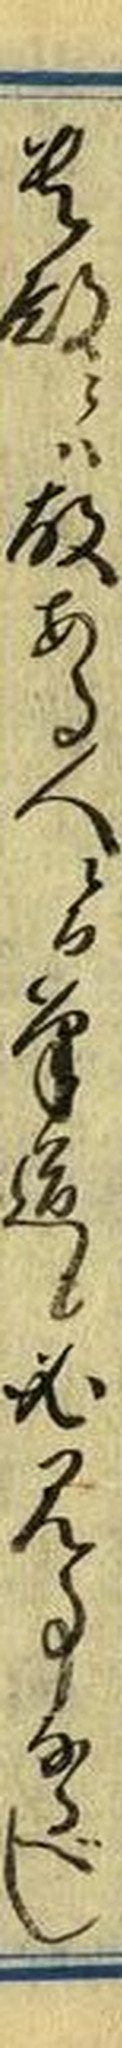貴殿には故ある人に而筆道も必見事なるべし
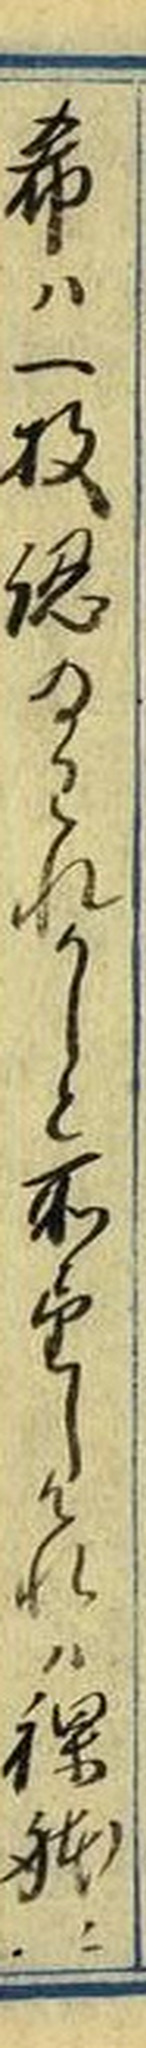希は一枚認給われかしと所望しけれは裸体に
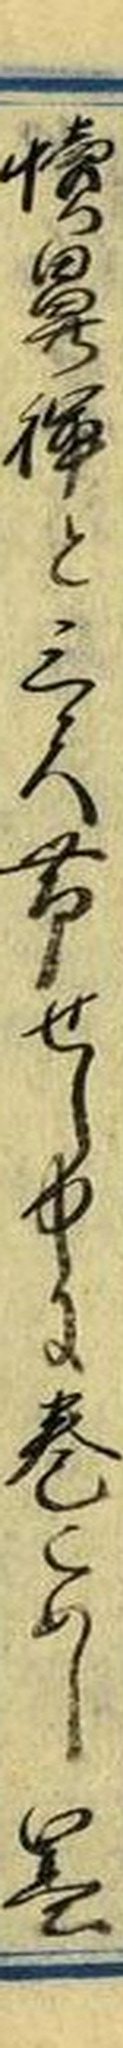犢鼻褌と三尺帯せし中に巻こめし墨
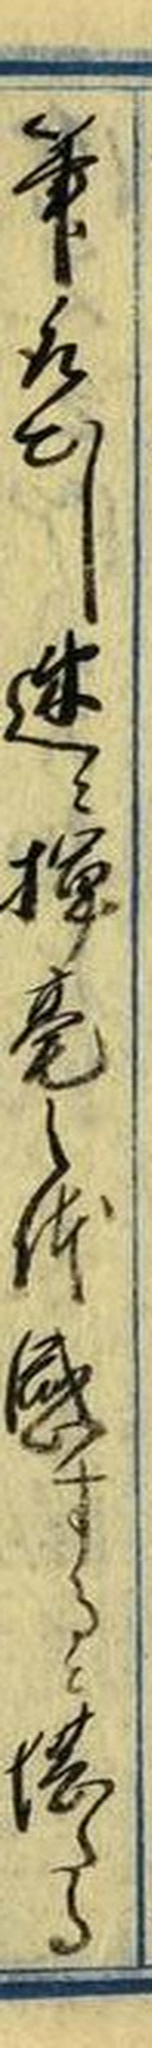筆取出し速に揮毫之体感するに堪たる
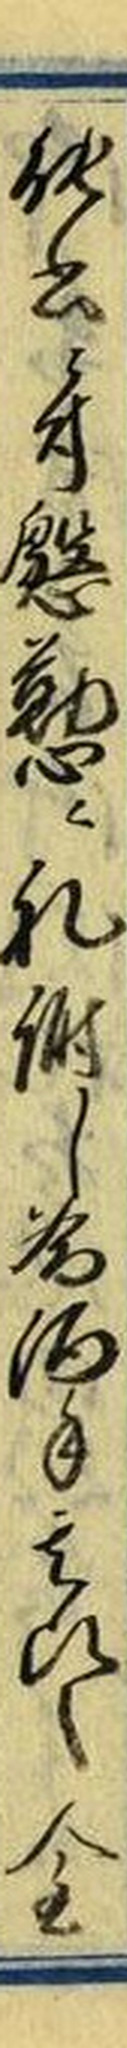能書に付慇懃に礼謝し為酒手其頃之金
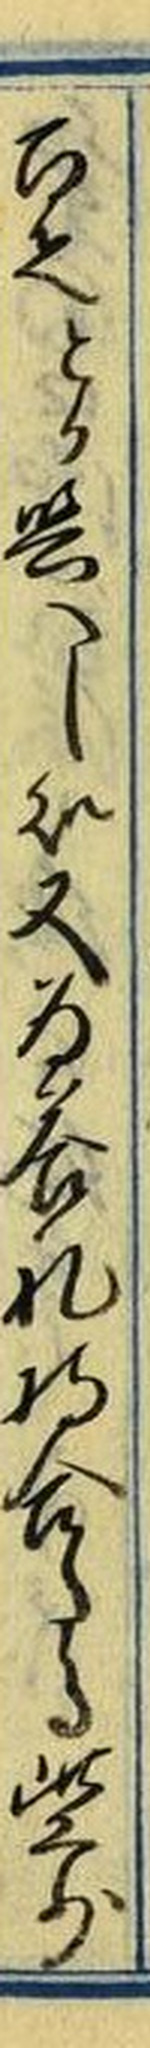百疋とか与へし処又為答礼持合たる些少
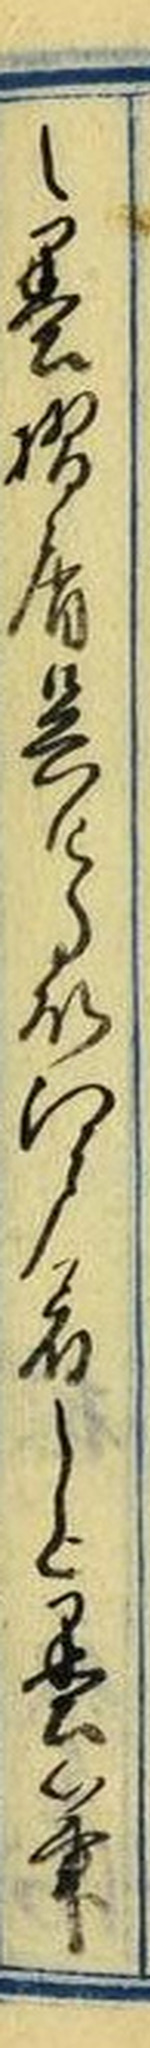之墨摺屑呉ける故江戸着し上墨筆
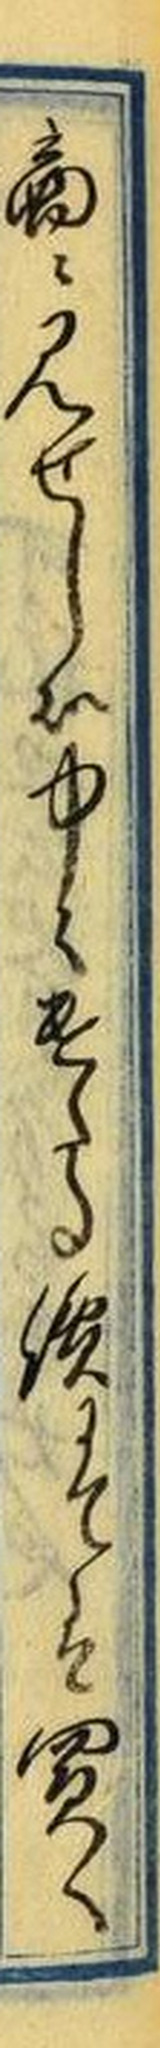商に見せし処中々遣たる價にては買へ
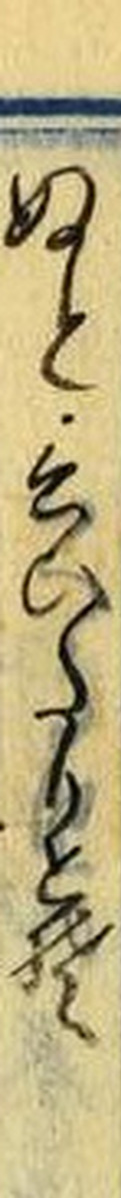ぬと言いたりとそ
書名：温古集 四巻
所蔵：福井県文書館 Fukui Prefectural Archives
